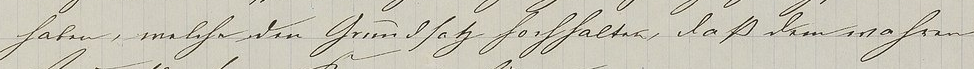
haben, welche den Grundsatz hochhalten, daß dem wahren
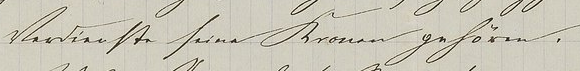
Verdienste seine Kronen gehören.
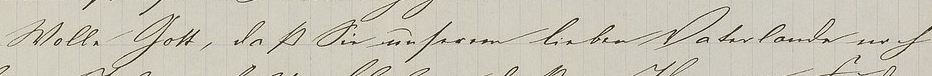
Wolle Gott, daß Sie unserem lieben Vaterlande noch
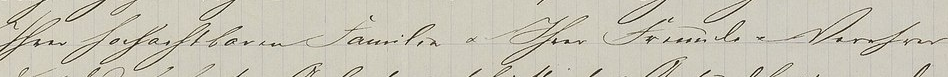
Ihrer hochachtbaren Familie & Ihrer Freunde & Verehrer
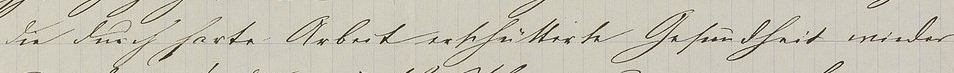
die durch harte Arbeit erschütterte Gesundheit wieder
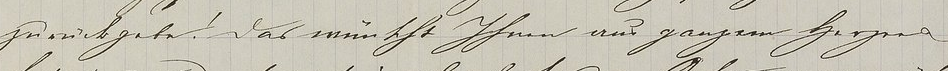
zurückgebe! Das wünscht Ihnen aus ganzem Herzen &
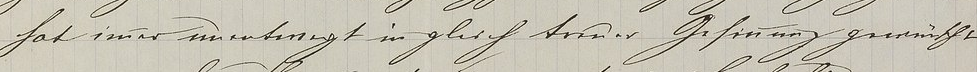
hat immer unentwegt in gleich treuer Gesinnung gewünscht
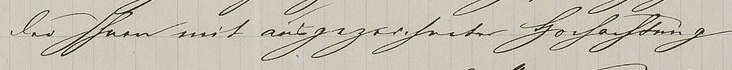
der Ihnen mit ausgezeichneter Hochachtung
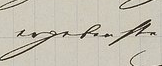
ergebenste
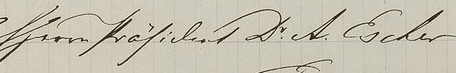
HHerrn Präsident Dr A. Escher
